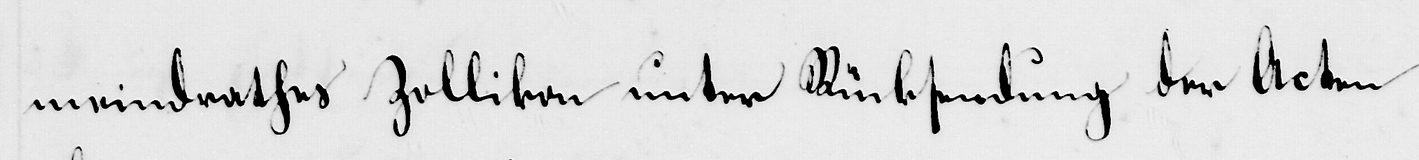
meindrathes Zollikon unter Rücksendung der Acten
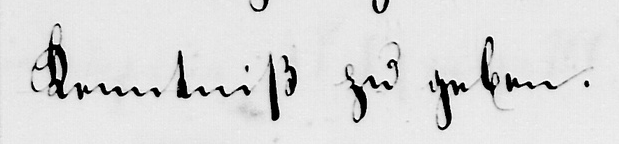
Kenntniß zu geben.
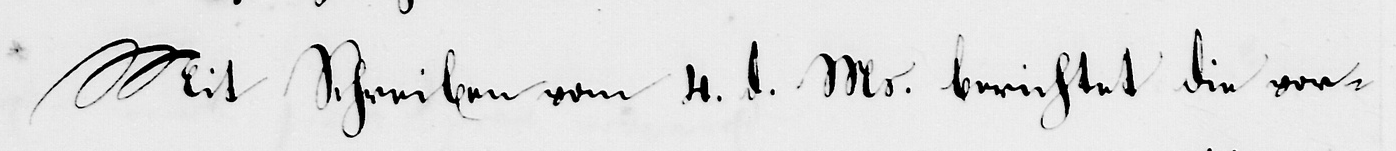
Mit Schreiben vom 4. d. Ms. berichtet die vor¬
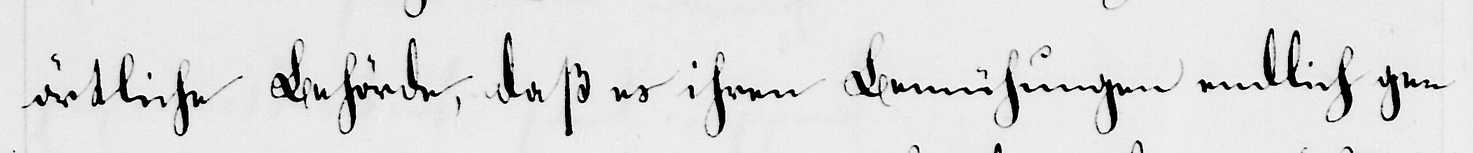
örtliche Behörde, daß es ihren Bemühungen endlich ge¬
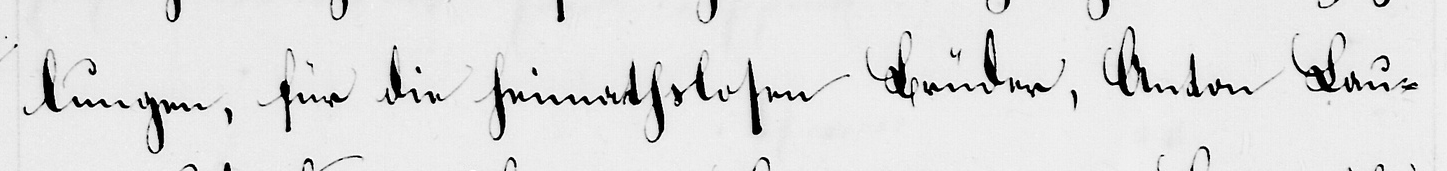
lungen, für die heimathslosen Brüder, Anton Lau¬
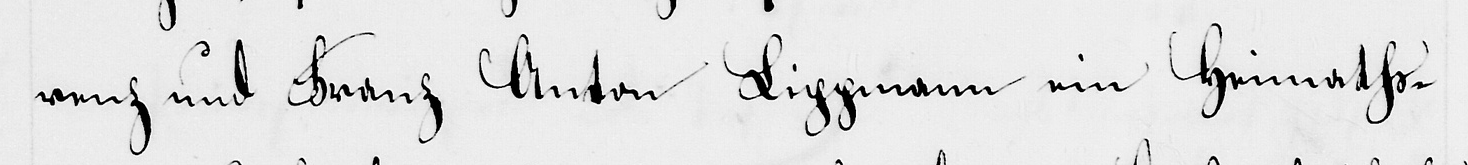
renz und Franz Anton Lippmann ein Heimaths¬
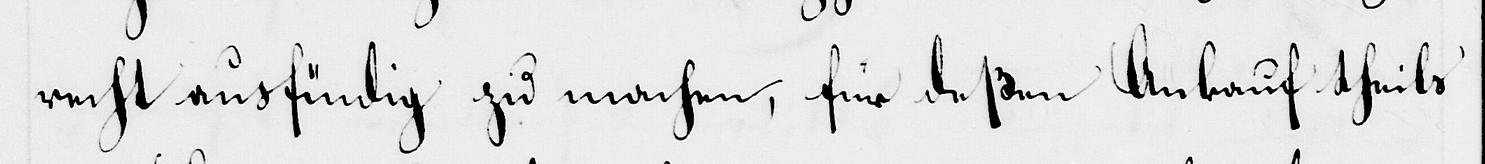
recht ausfündig zu machen, für deßen Ankauf theils
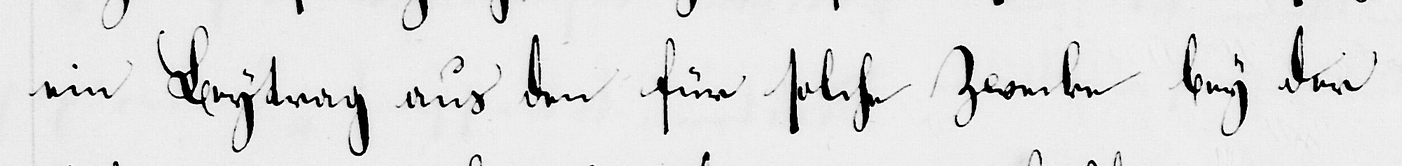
ein Beytrag aus den für solche Zwecke bey der
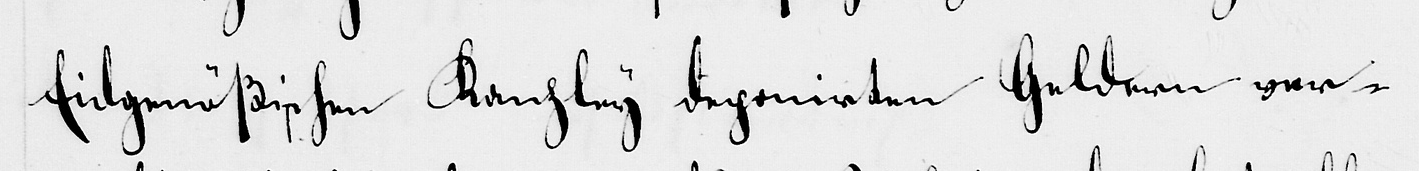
Eidgenößischen Kanzley deponirten Geldern ver¬
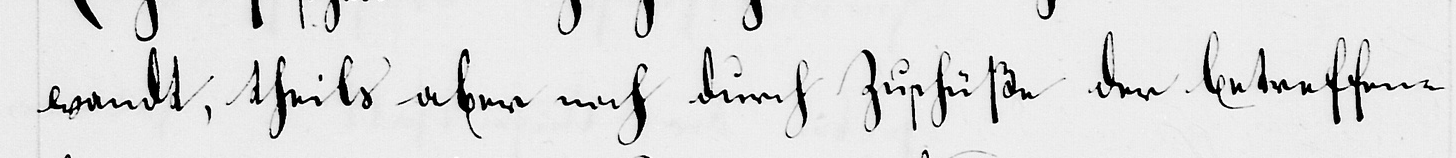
wandt, theils aber noch durch Zuschüße der betreffen¬
